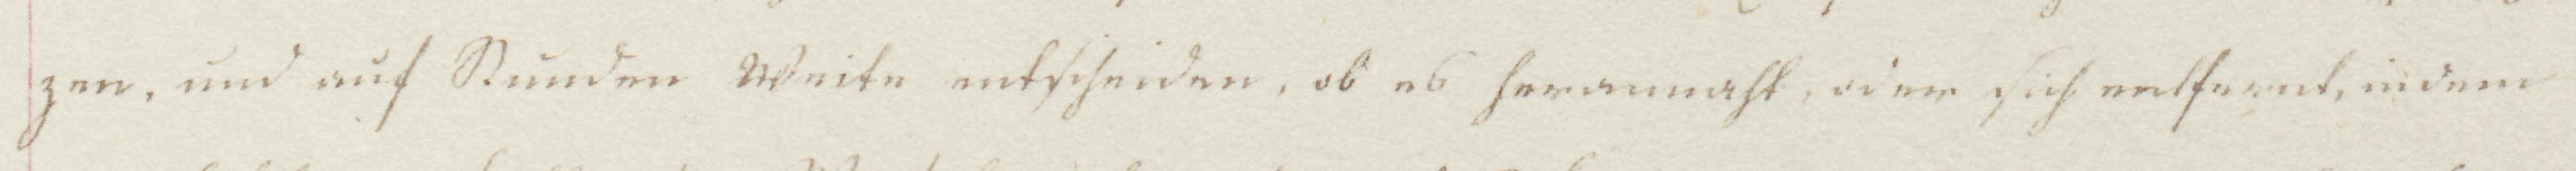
zen, und auf Stunden Weite entscheiden, ob es herannaht, oder sich entfernt, indem
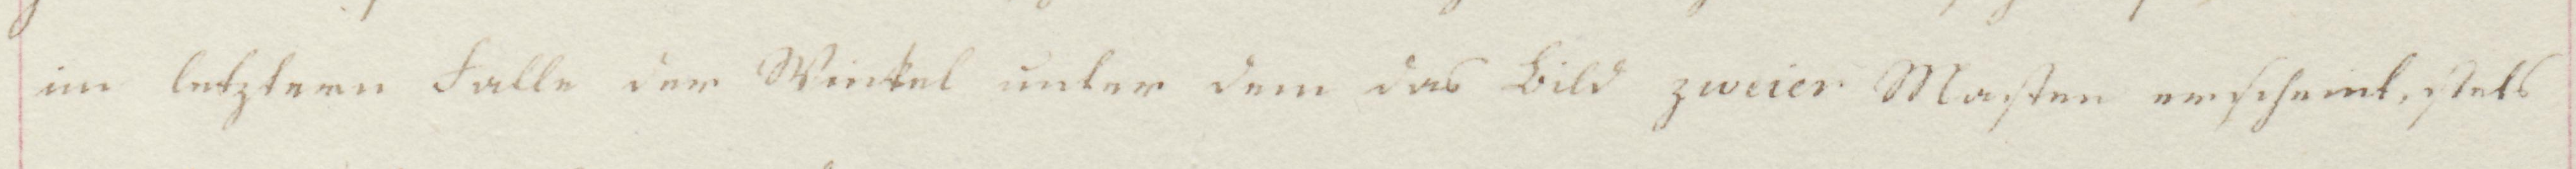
im letztern Falle der Winkel unter dem das Bild zweier Masten erscheint, stets
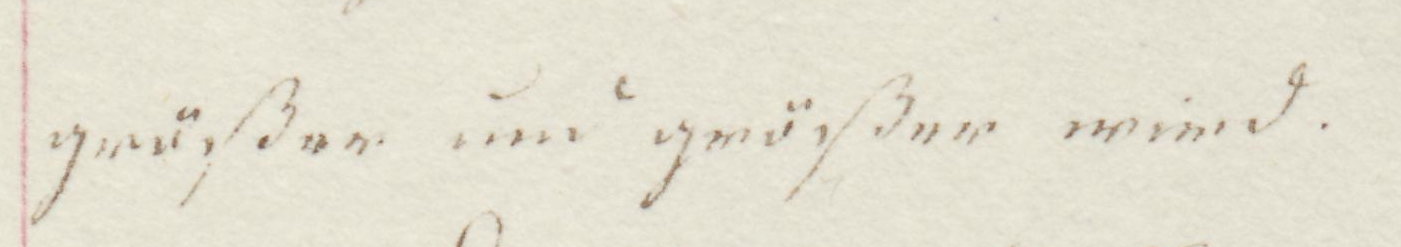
größer und größer wird.
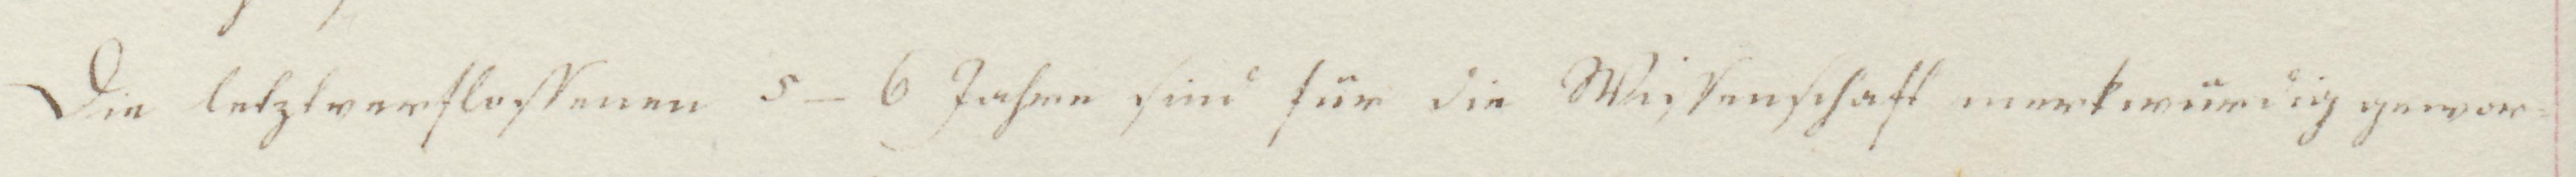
Die letztverflossenen 5–6 Jahre sind für die Wissenschaft merkwürdig gewor-
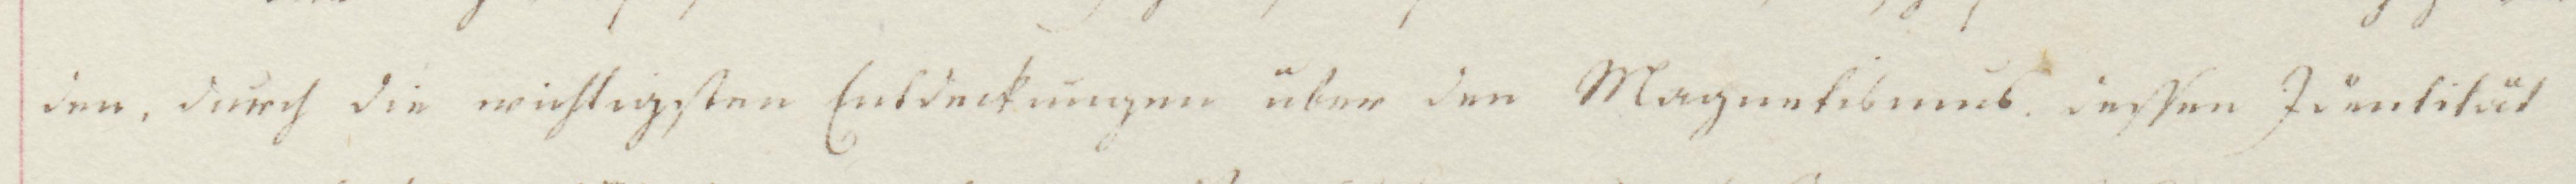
den, durch die wichtigsten Entdeckungen über den Magnetismus, dessen Identität
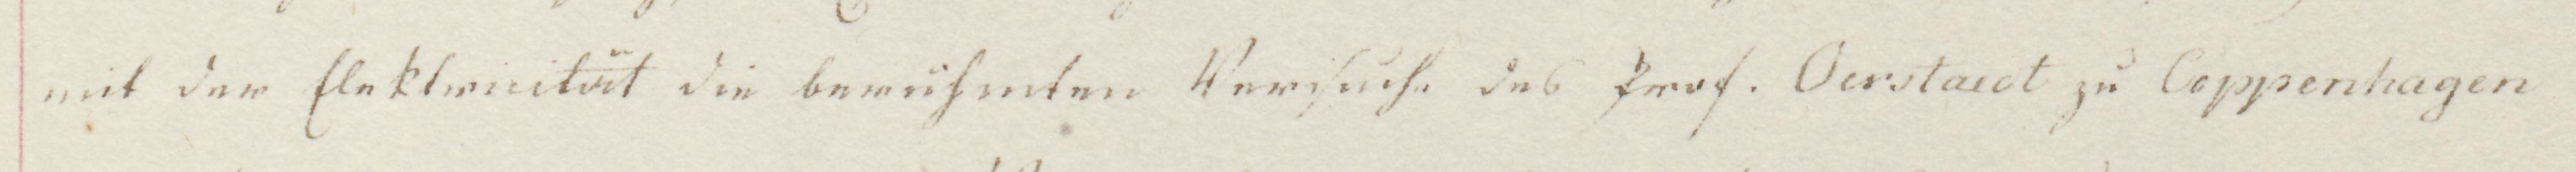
mit der Elektricität die berühmten Versuche des Prof. Oerstaedt zu Coppenhagen
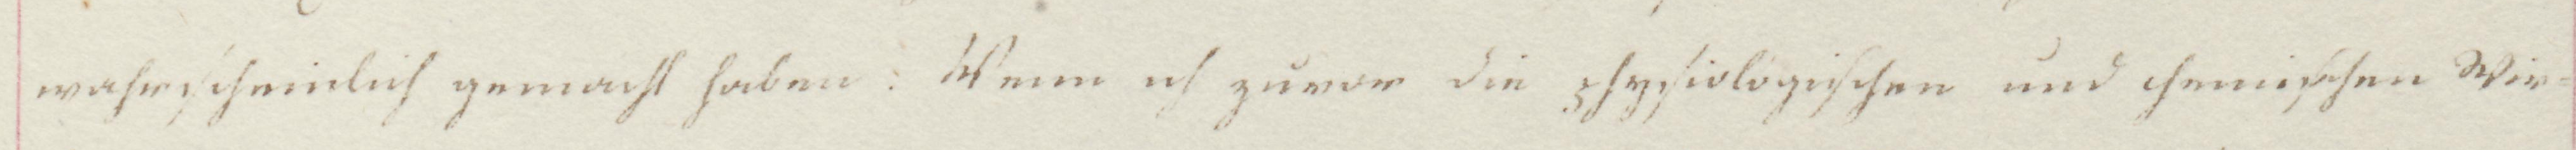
wahrscheinlich gemacht haben. Wenn ich zuvor die physiologischen und chemischen Wir-
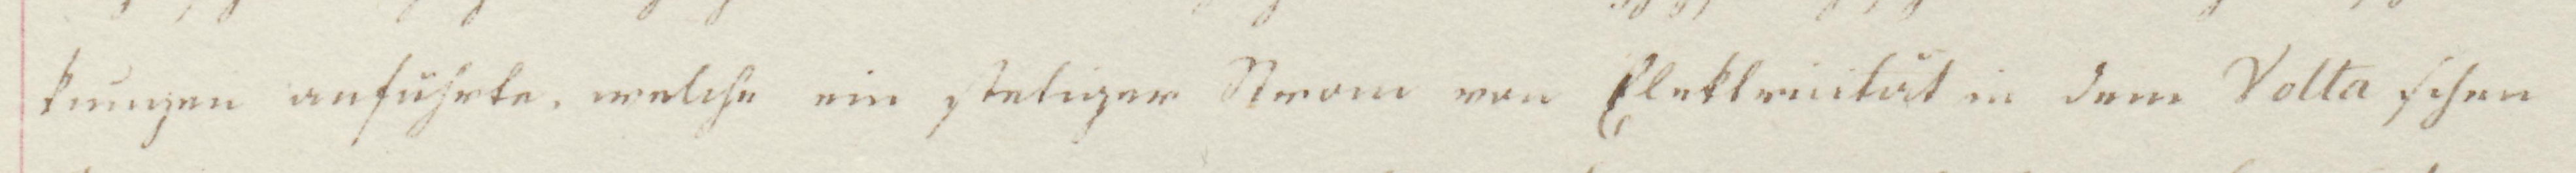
kungen anführte, welche ein stetiger Strom von Elektricität in dem Voltaschen
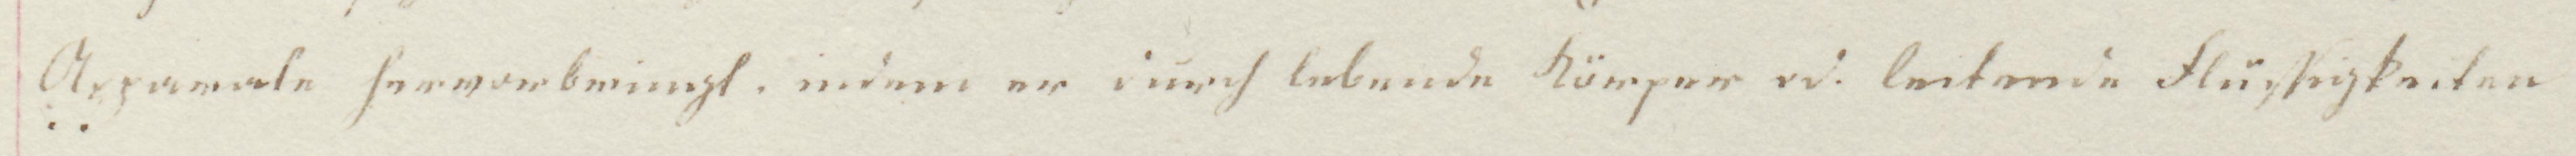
Apparate hervorbringt, indem er durch lebende Körper od. leitende Flüssigkeiten
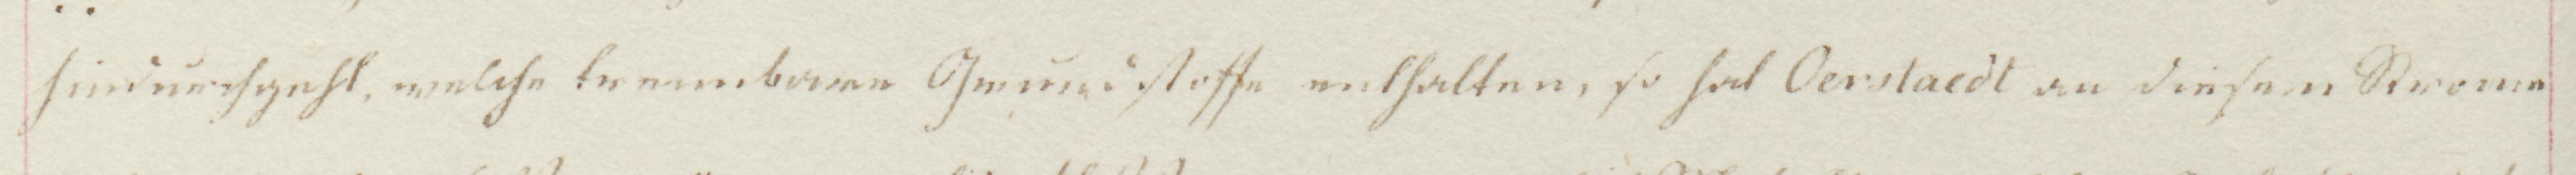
hindurchgeht, welche trennbare Grundstoffe enthalten, so hat Oerstaedt an Strome
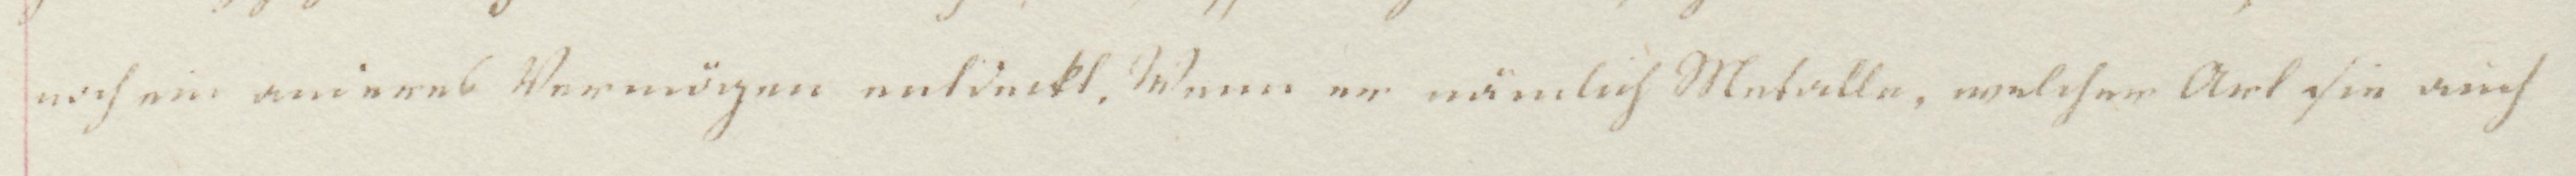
noch ein anderes Vermögen entdeckt. Wenn er nämlich Metalle, welcher Art sie auch
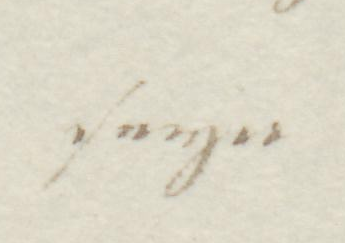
seyn
